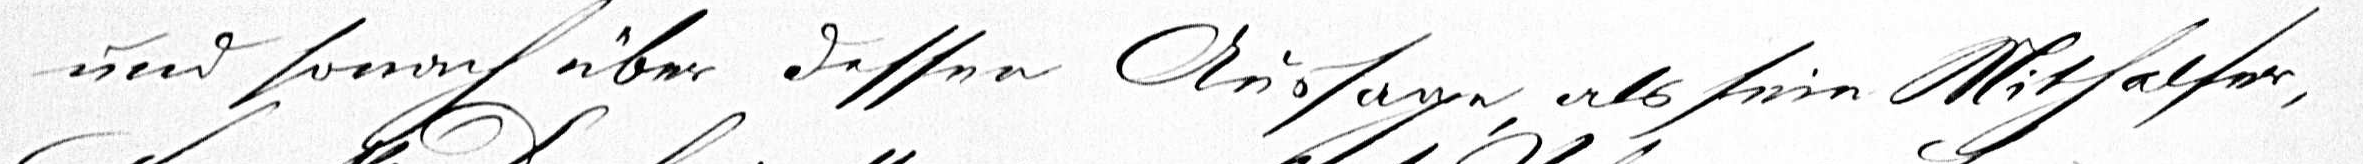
und sonach über dessen Aussage, als sein Mithalser,
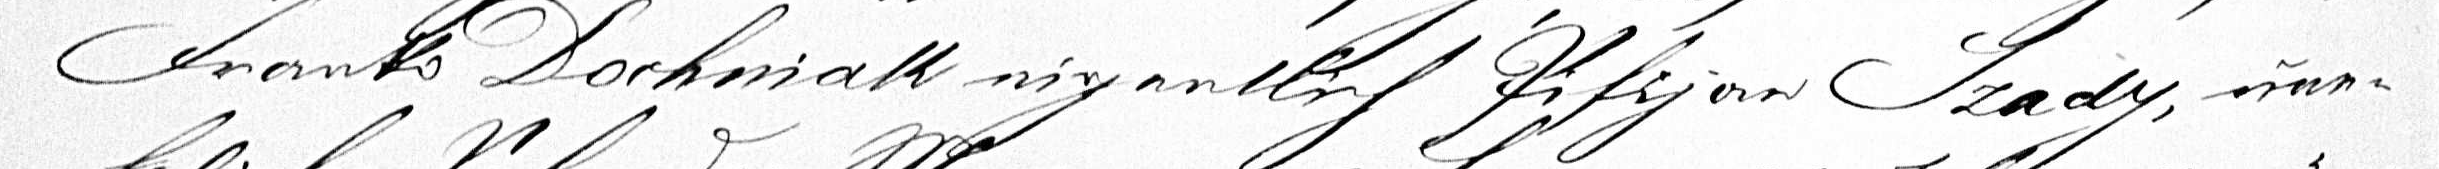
Franko Dochniak eigentlich Pisijan Szady, un¬
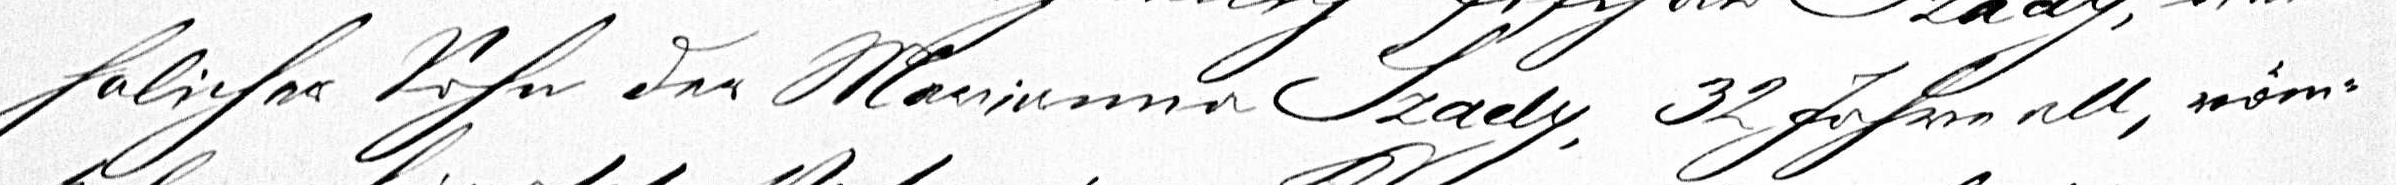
ehelicher Sohn der Marianna Szady, 32 Jahre alt, röm¬
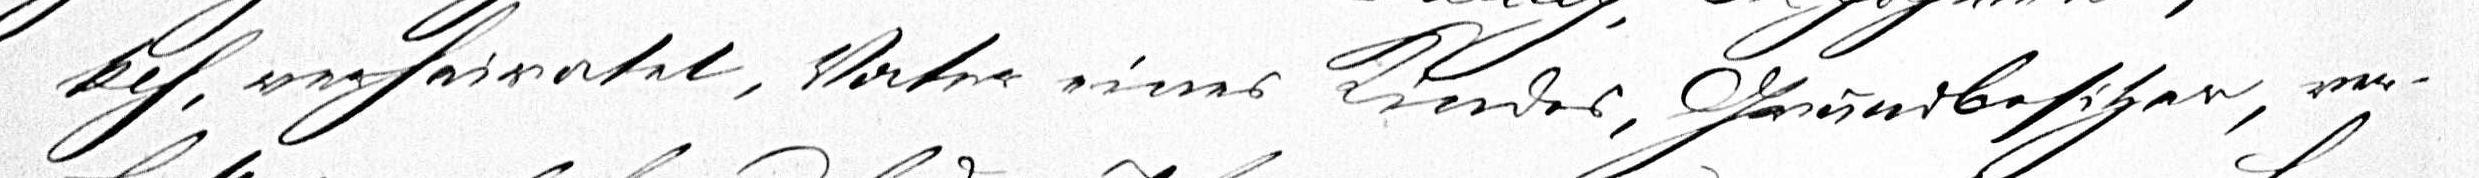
xx, verheiratet, Vater eines Kindes, Grundbesitzer, ver¬
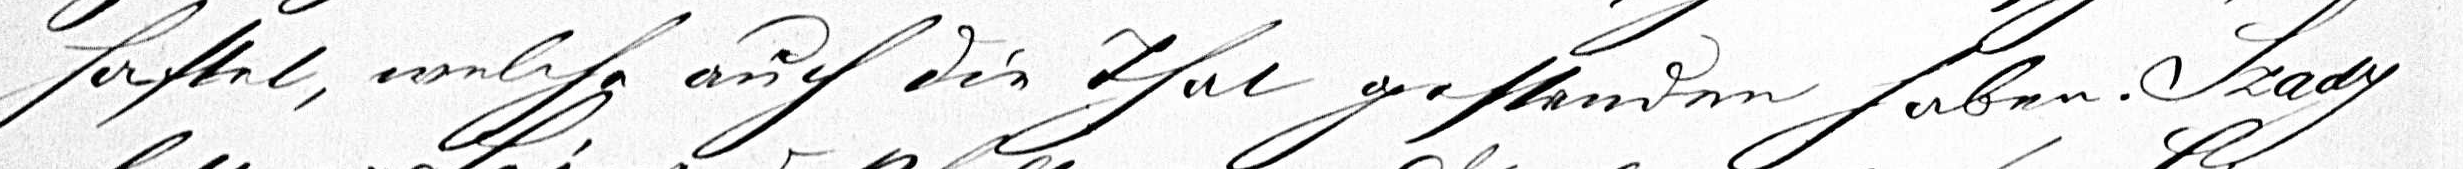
haftet, welche auch die That gestanden haben. Szady
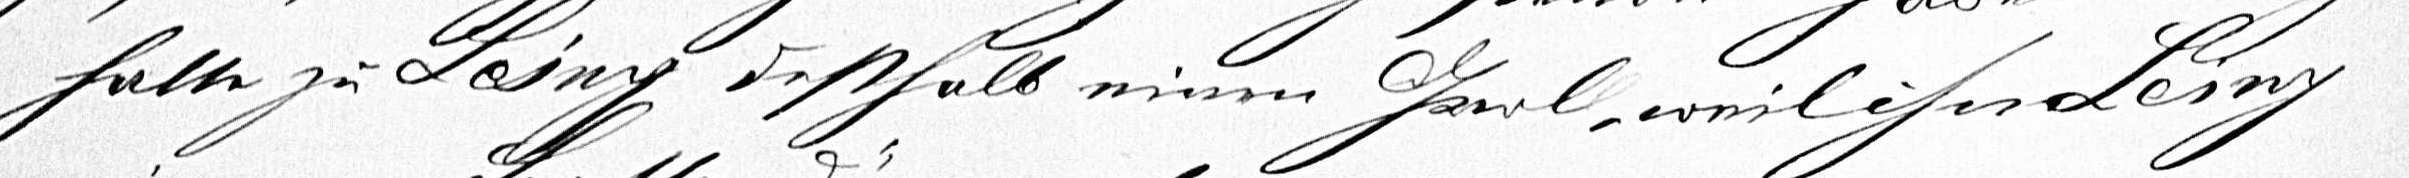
hatte zu Leśny deßhalb einen xx Leśny
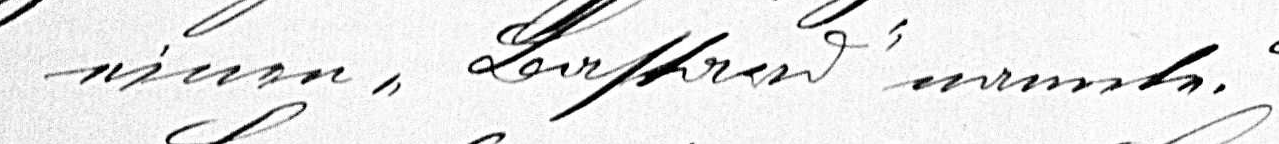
einen = Bastard=nannte.
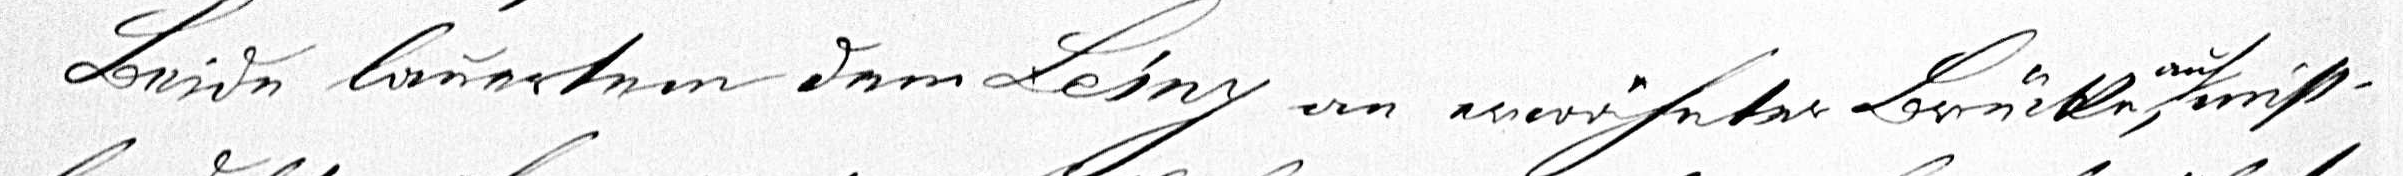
Beide lauertem dem Leśny an erwähnter Brücke auf, miß¬
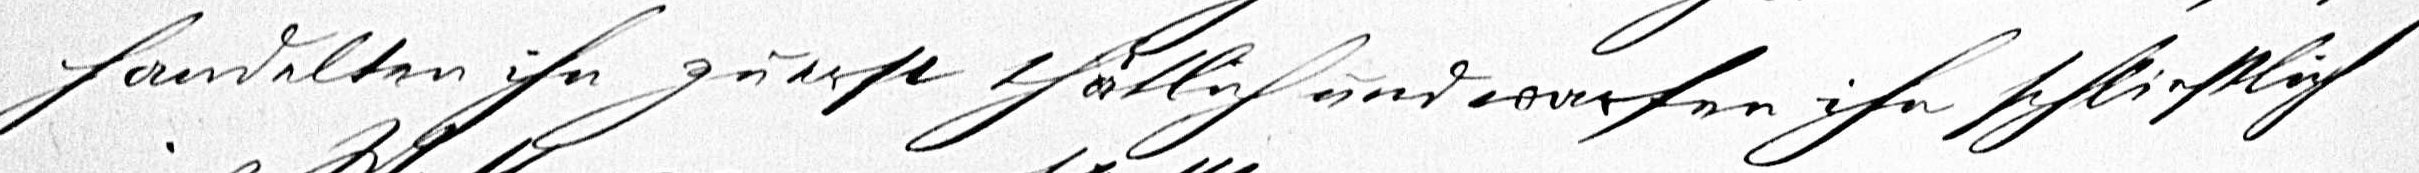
handelten ihn zuerst thätlich und warfen ihn schließlich
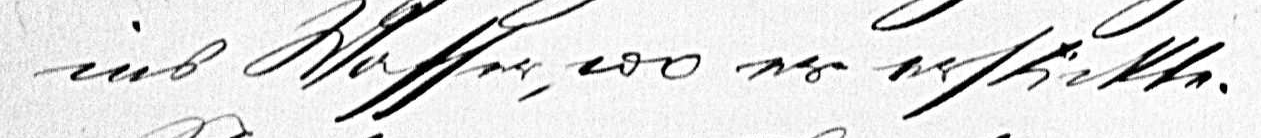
ins Wasser, wo er erstickte.
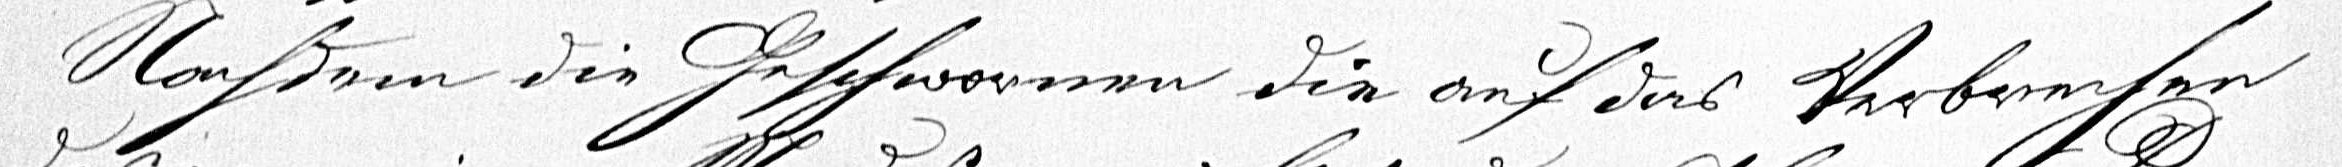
Nachdem die Geschwornen die auf das Verbrechen
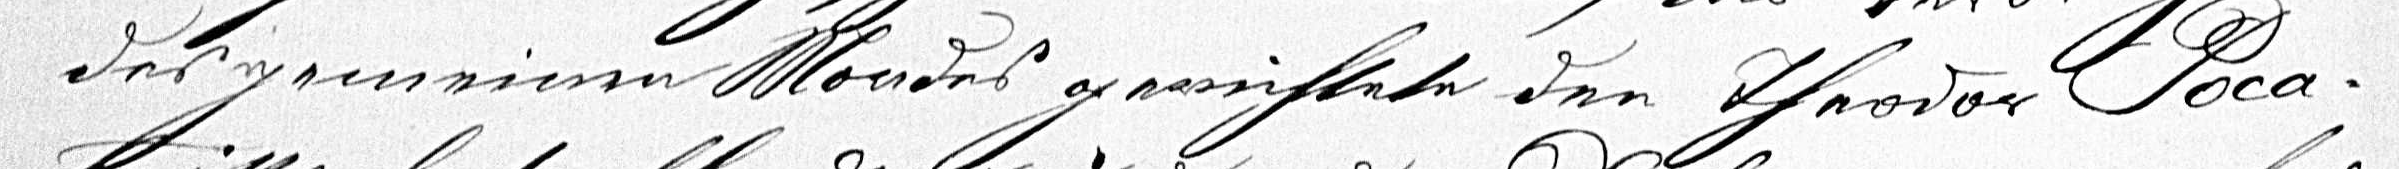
des gemeinen Mordes gerichtete den Theodor Poca¬
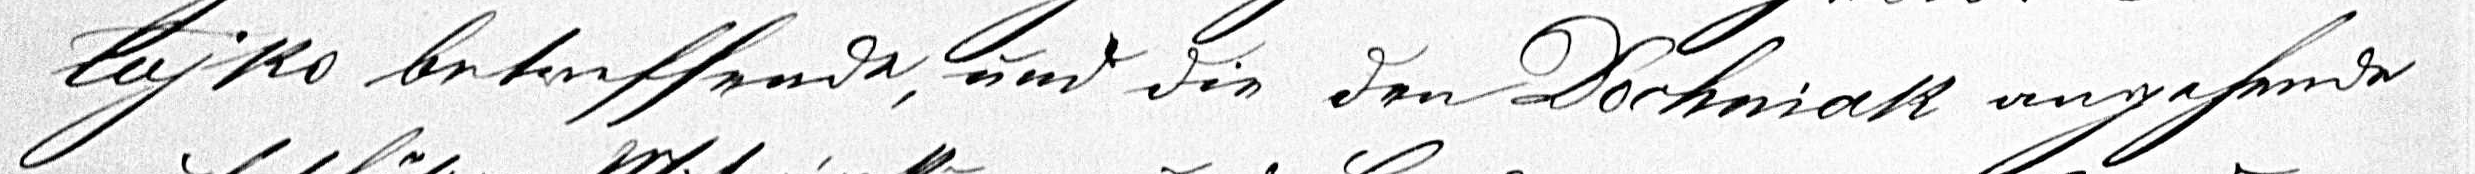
tvjko betreffende, und die den Dochniak angehende
